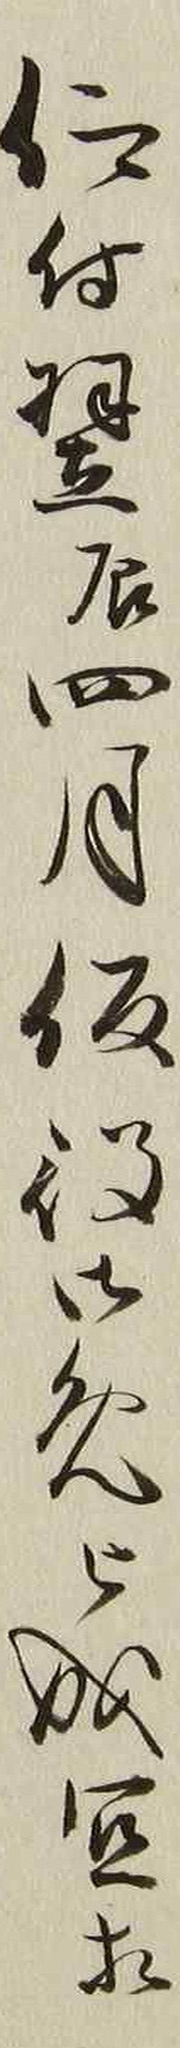仰付翌辰四月仮役御免被成宜相
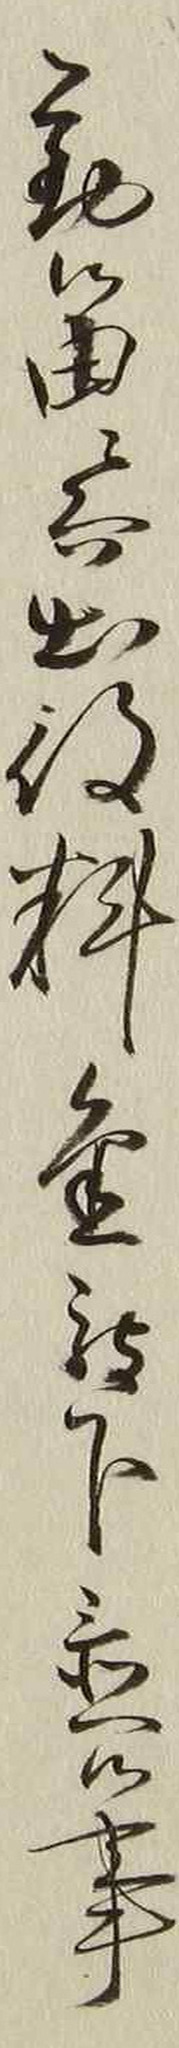勤候由ニ而出役料金被下置候事
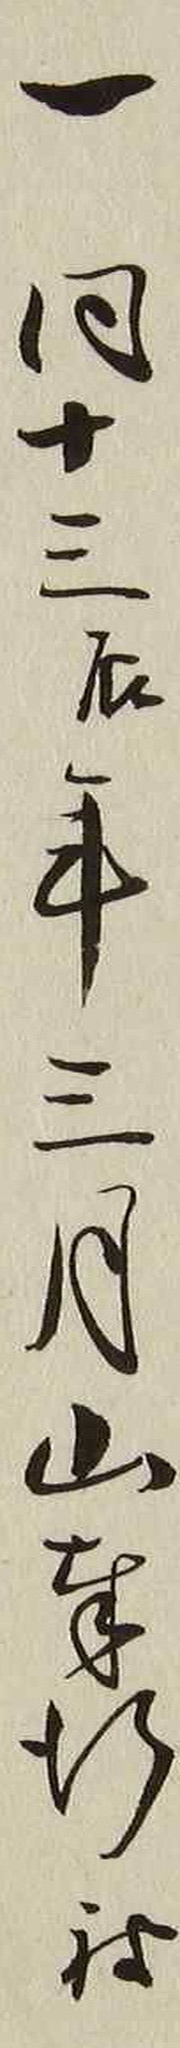一同十三辰年三月山奉行被
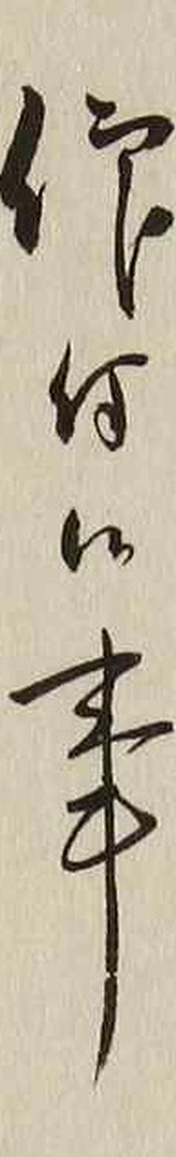仰付候事
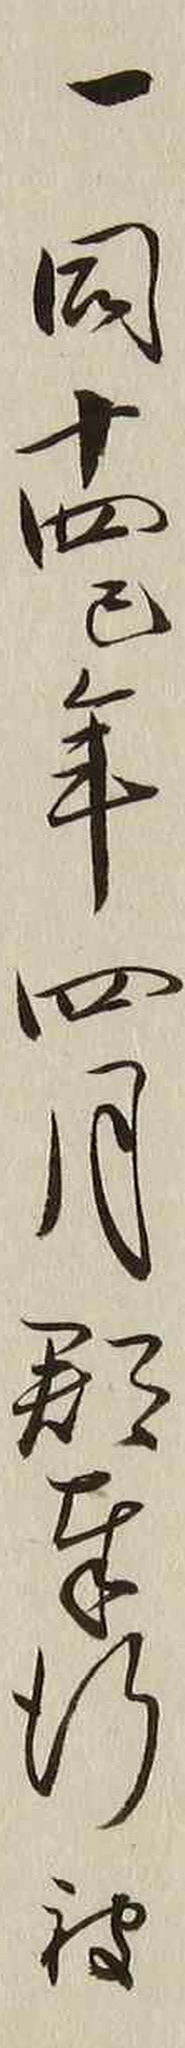一同十四巳年四月郡奉行被
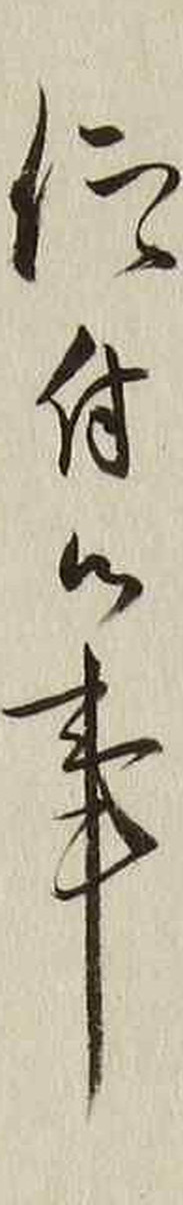仰付候事
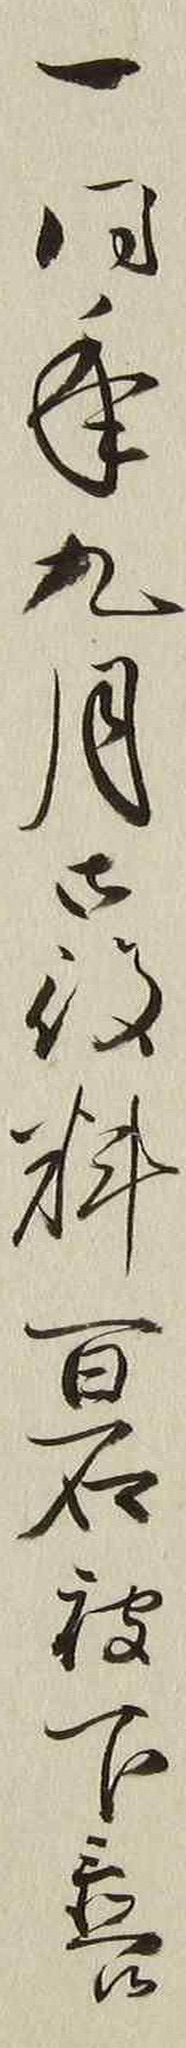一同年九月御役料百石被下置候
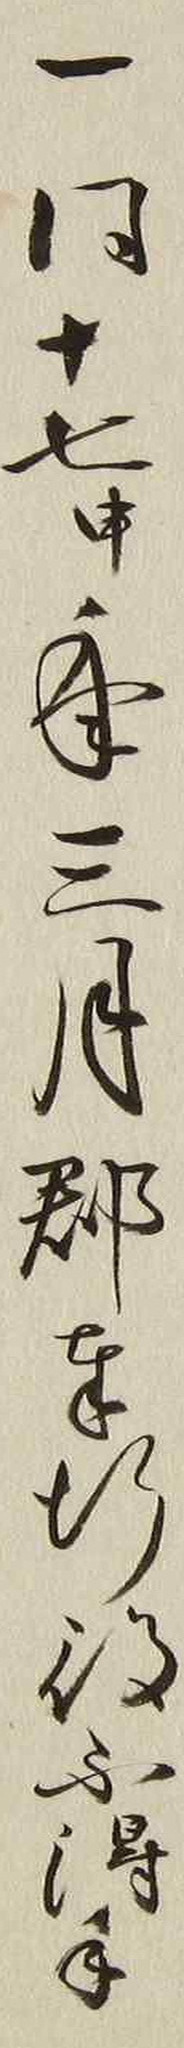一同十七申年三月郡奉行役不得手
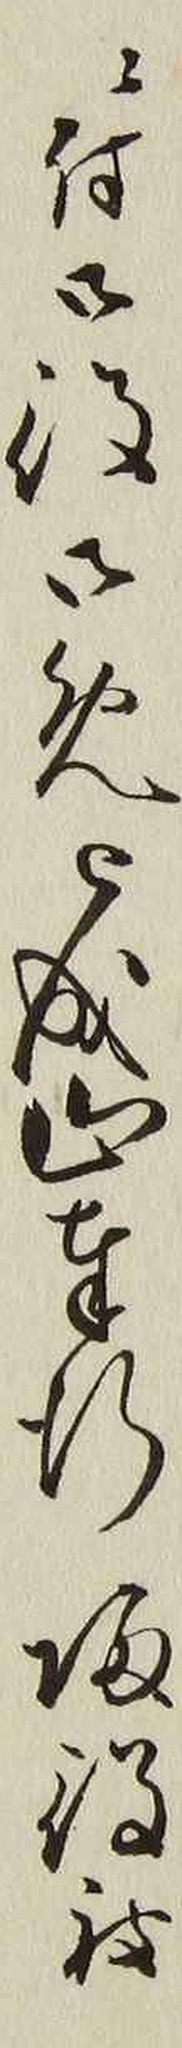ニ付御役御免被成山奉行帰役被
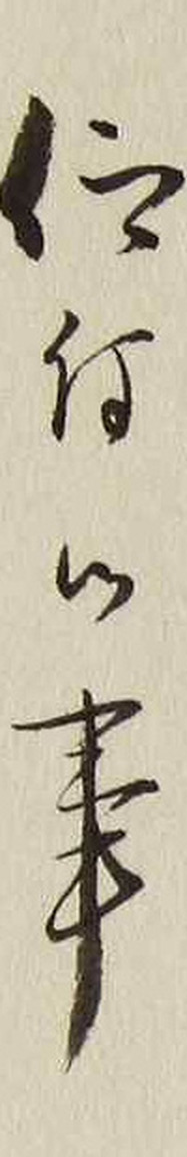仰付候事
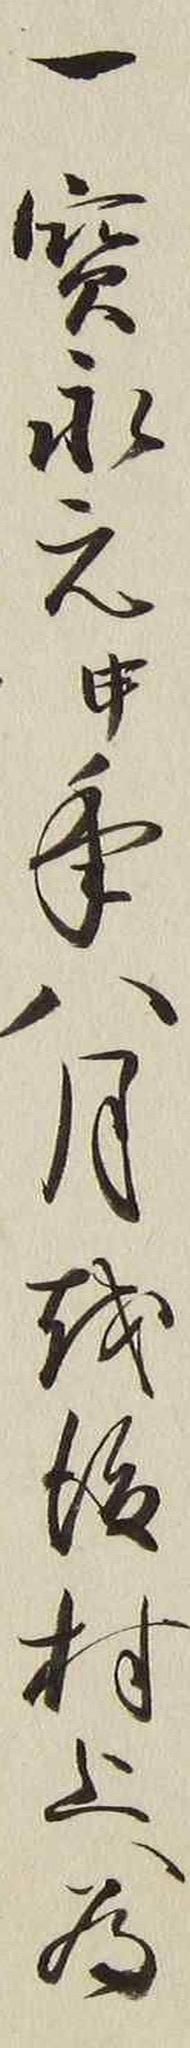一宝永元申年八月越後村上ㇸ為
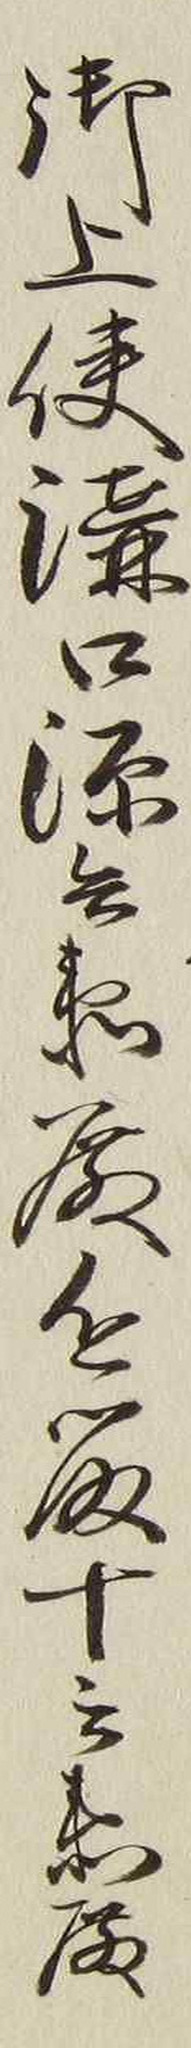御上使溝口源兵衛殿近藤十兵衛殿
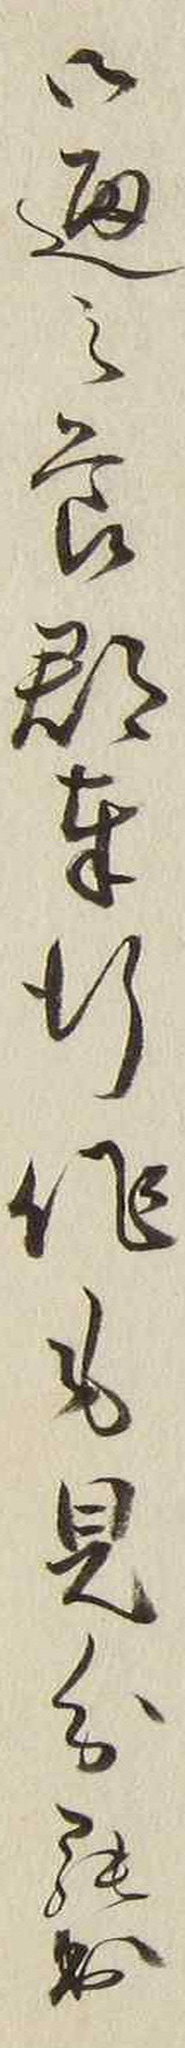御通之節郡奉行作毛見分罷出

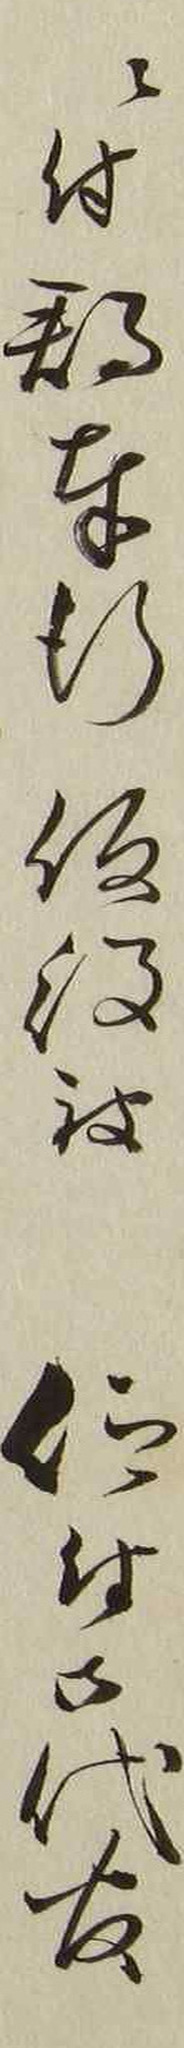ニ付郡奉行仮役被仰付御代官
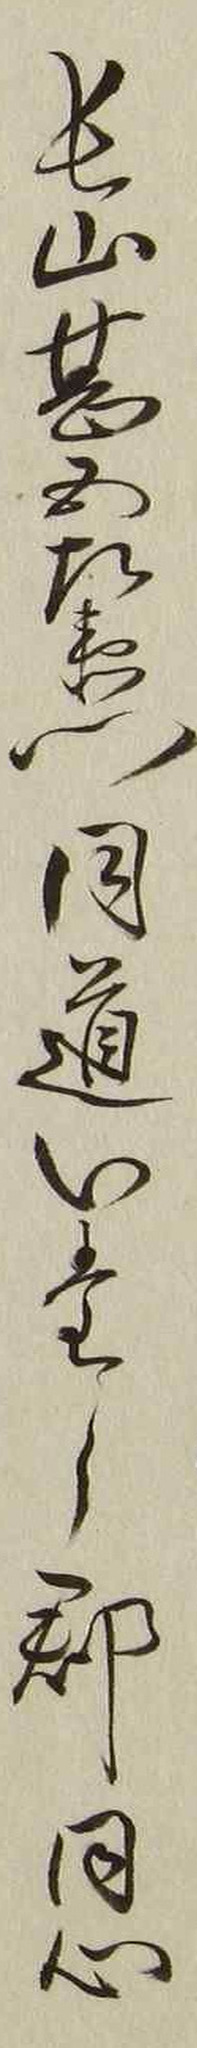長山甚五衛門同道いたし郡同心
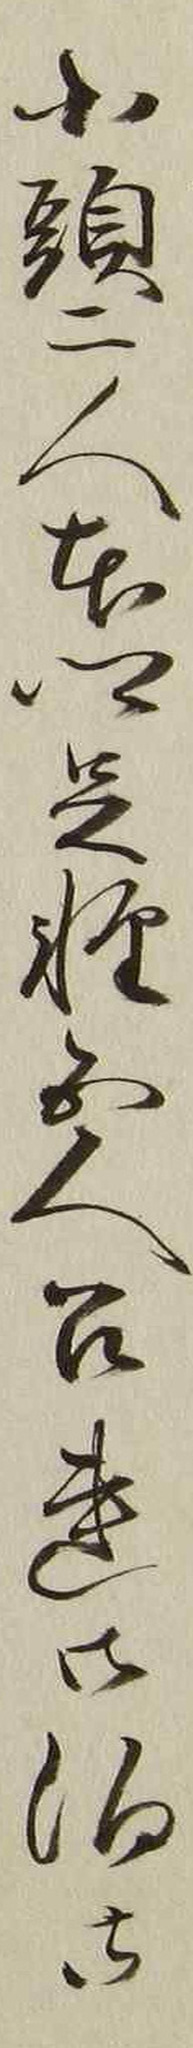小頭二人本郷足軽五人召連御酒御
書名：諸士系譜　巻之163　な之部5
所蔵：会津若松市立会津図書館
